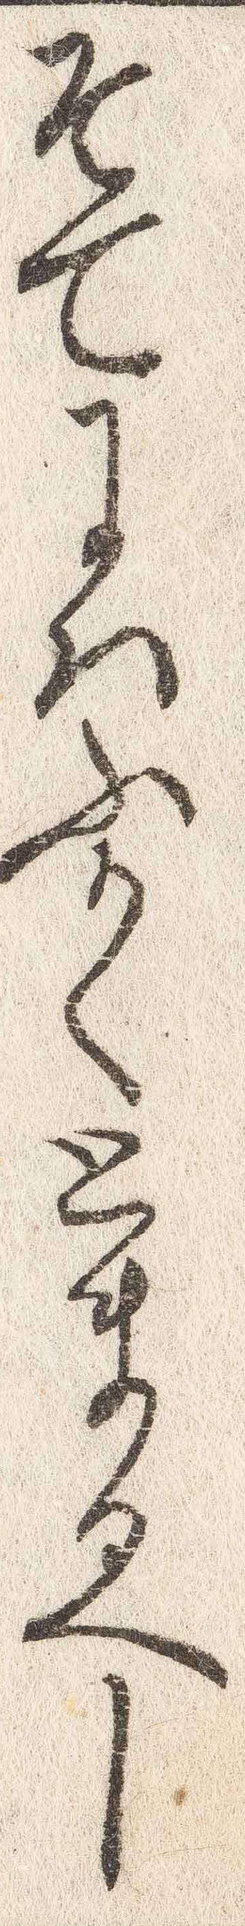そてにはふかくとまるへし
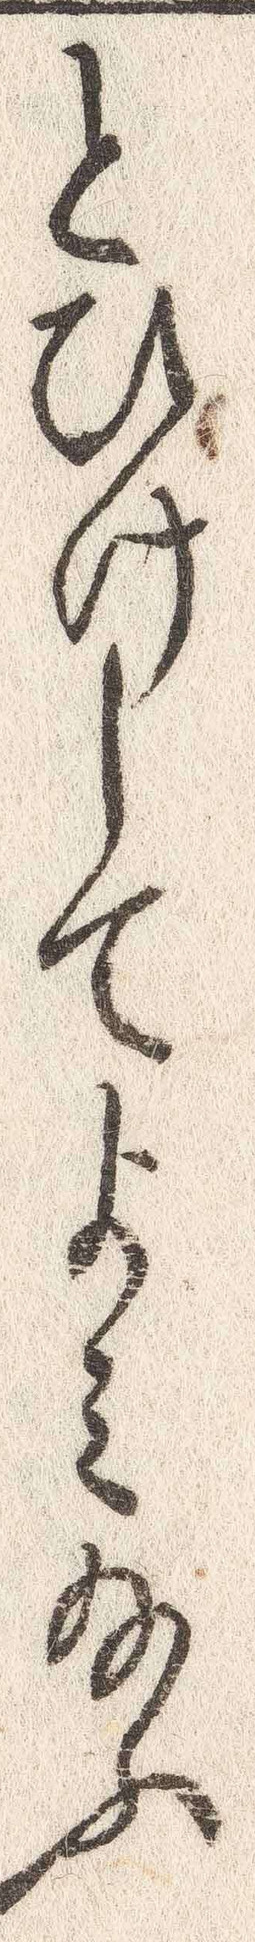とひけしてよみ給ふ
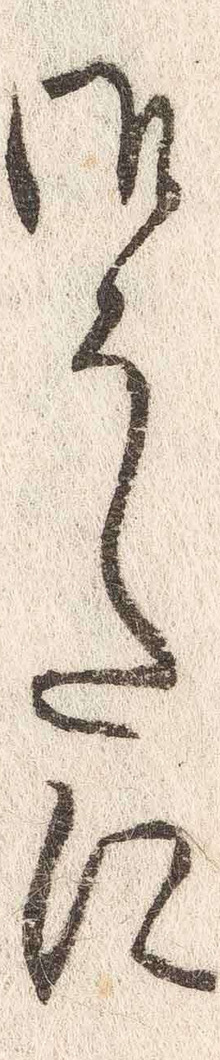御うたに
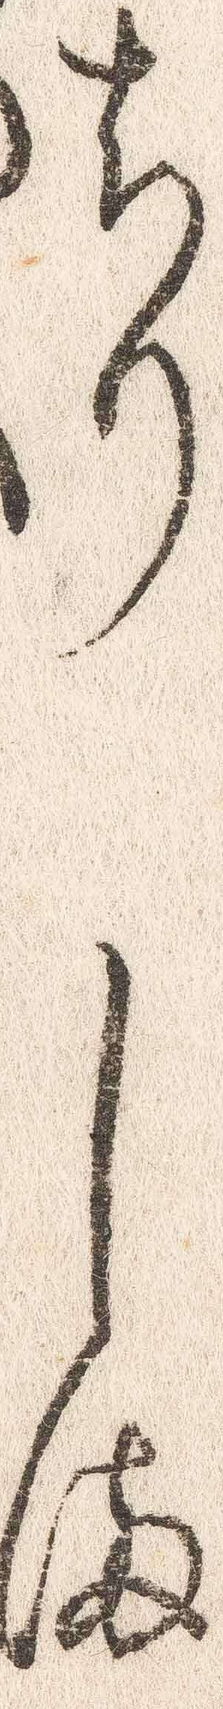ちりしま
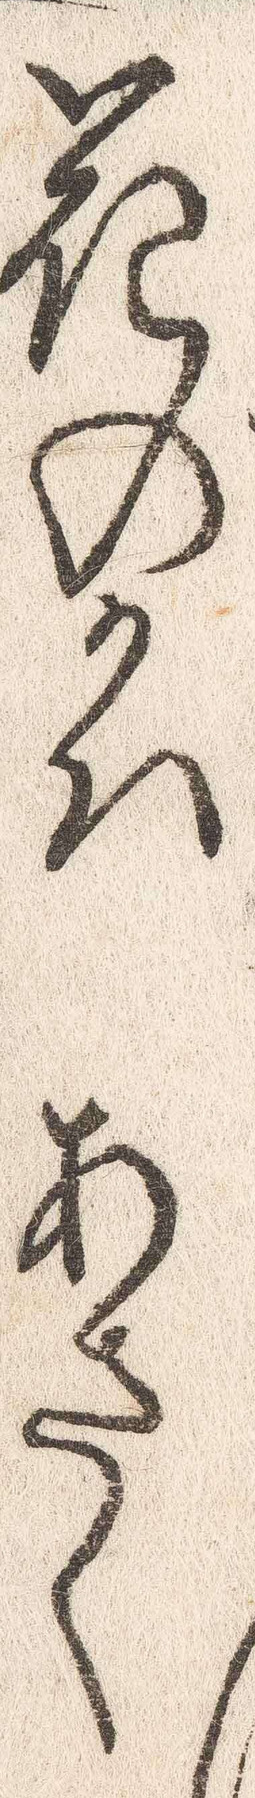花のかはあさく

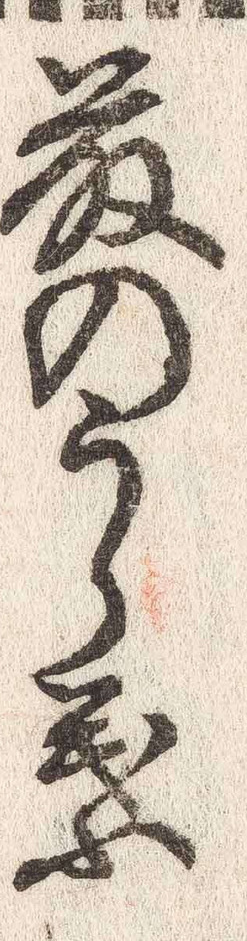藤のうら葉
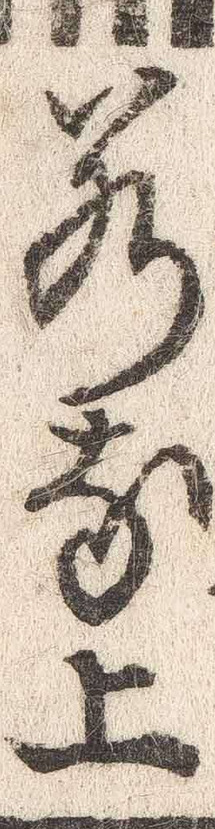若な上

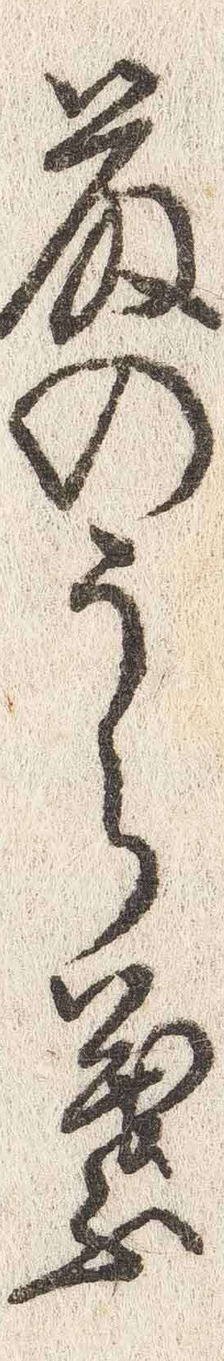藤のうら葉
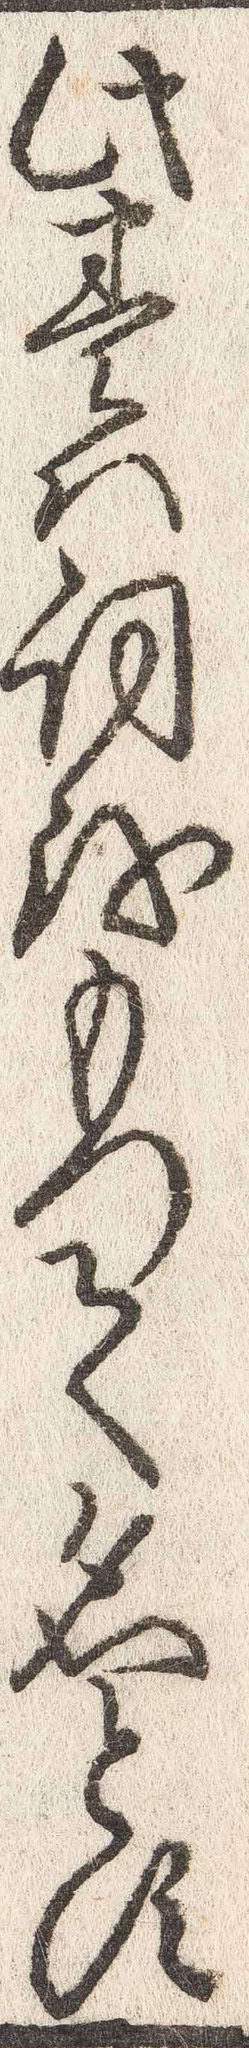此巻は詞をもつて名とす
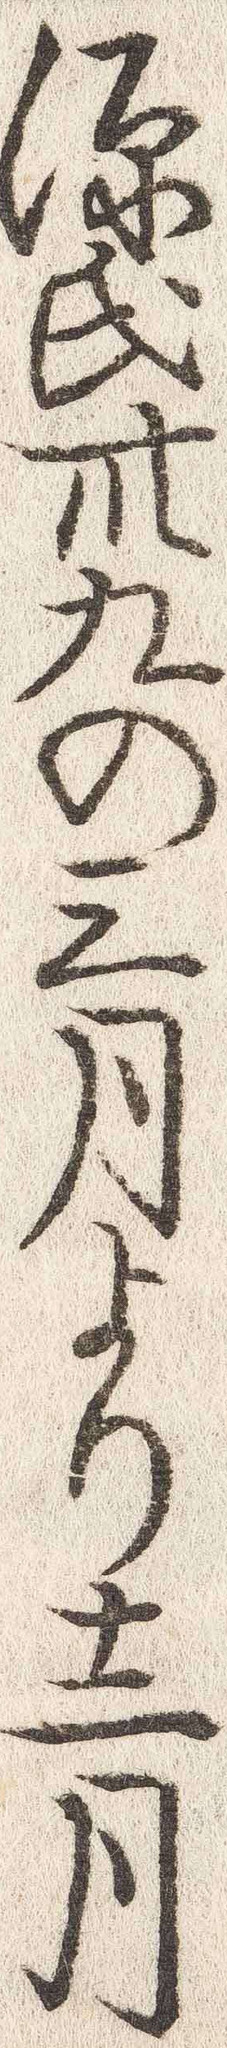源氏卅九の三月より十二月
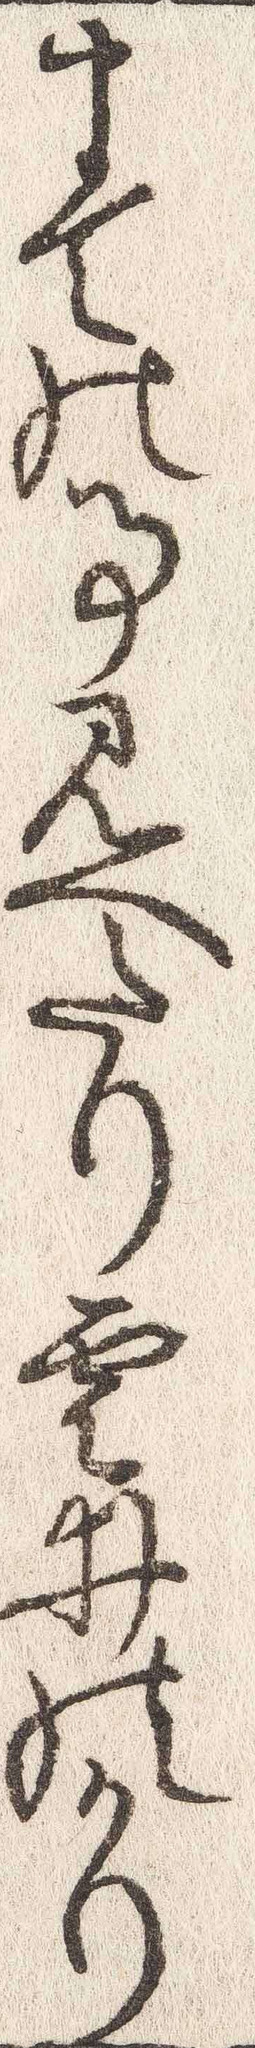まての事見へたり雲井のかり
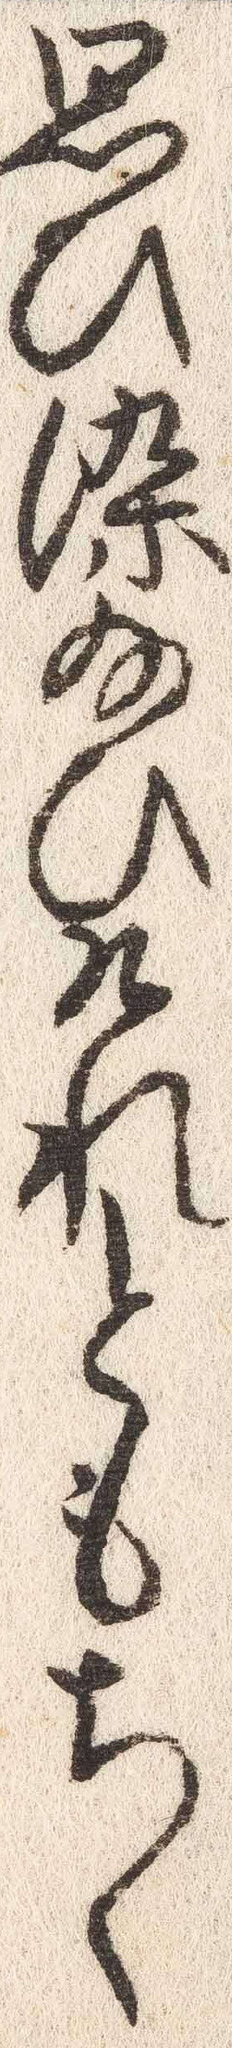思ひ染給ひけれともちゝ
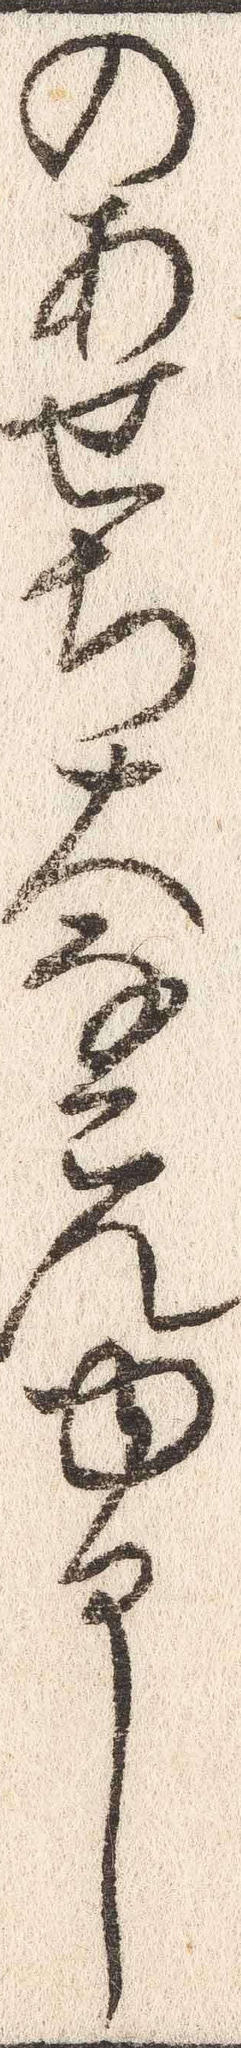のあせち大なこんゆるし
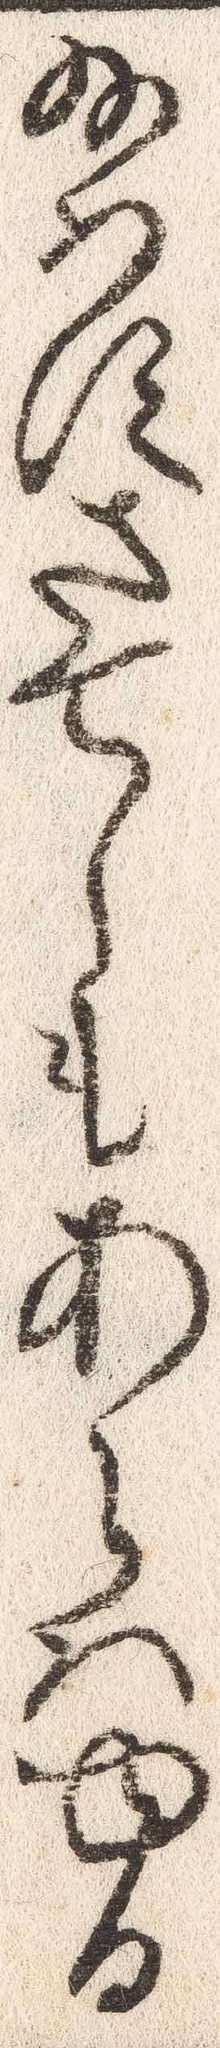給はすさてしもあらはゆる
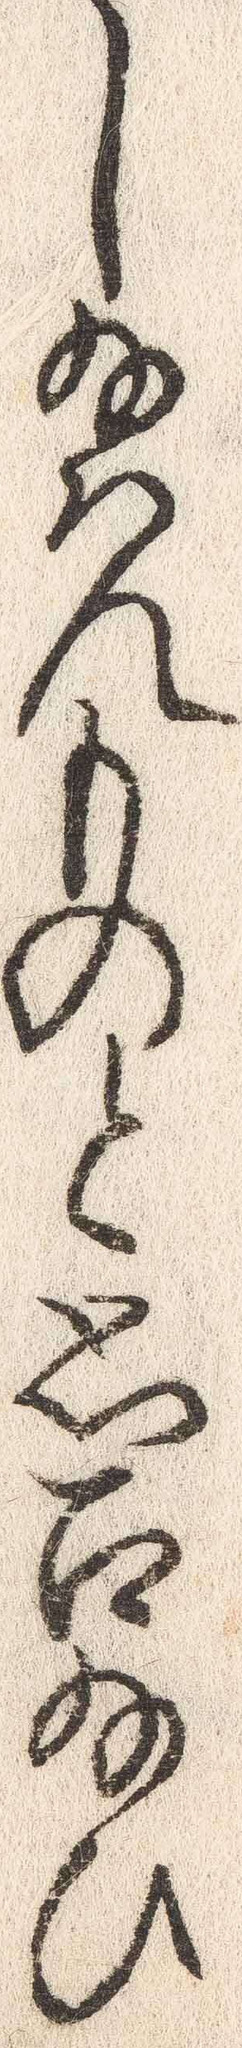し給はんものとも思召給ひ
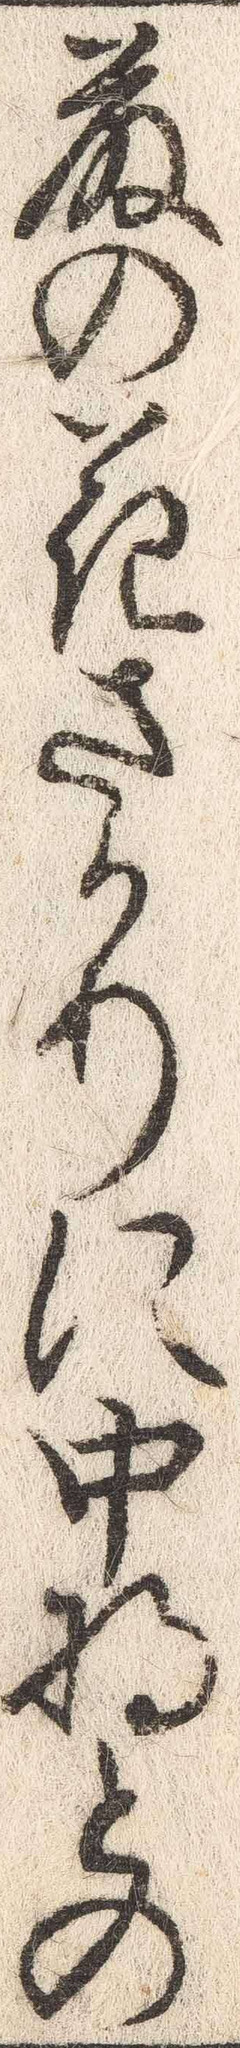藤の花さかりに中将との
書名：源氏物語
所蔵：東京学芸大学附属図書館 国文学研究資料館
